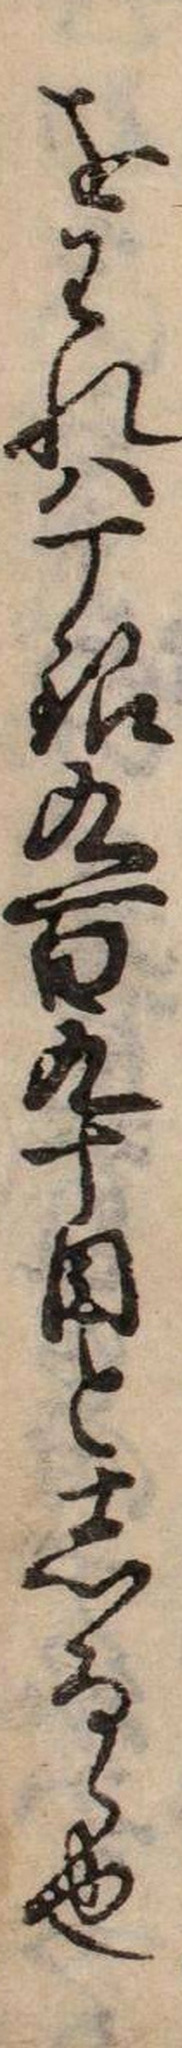をわれは丁銀九百九十目としるゝ也

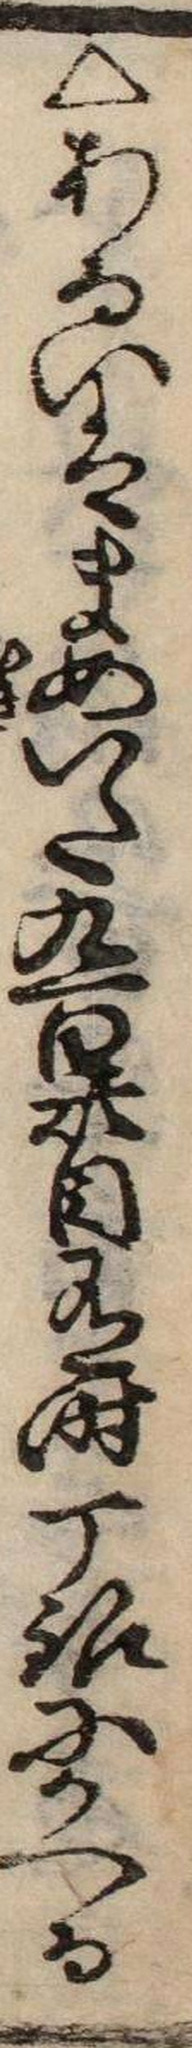△あるいはまめいた九百卅目有時丁銀にかへる
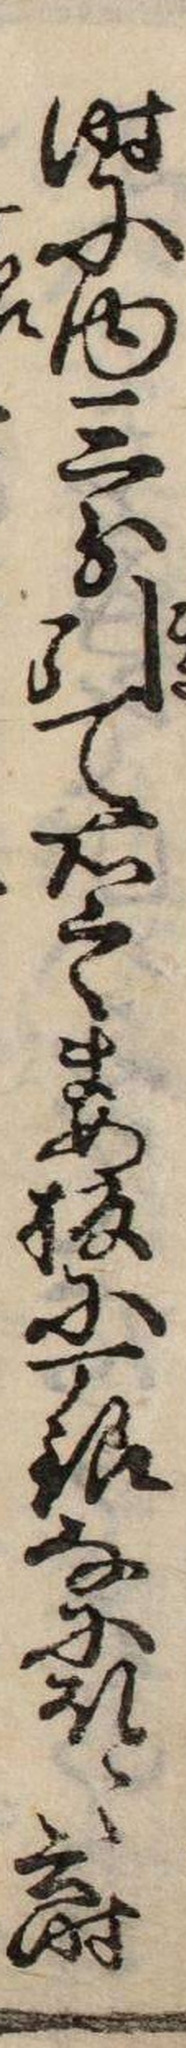時に内三分引て右のまめ板に丁銀なにほとゝ云時
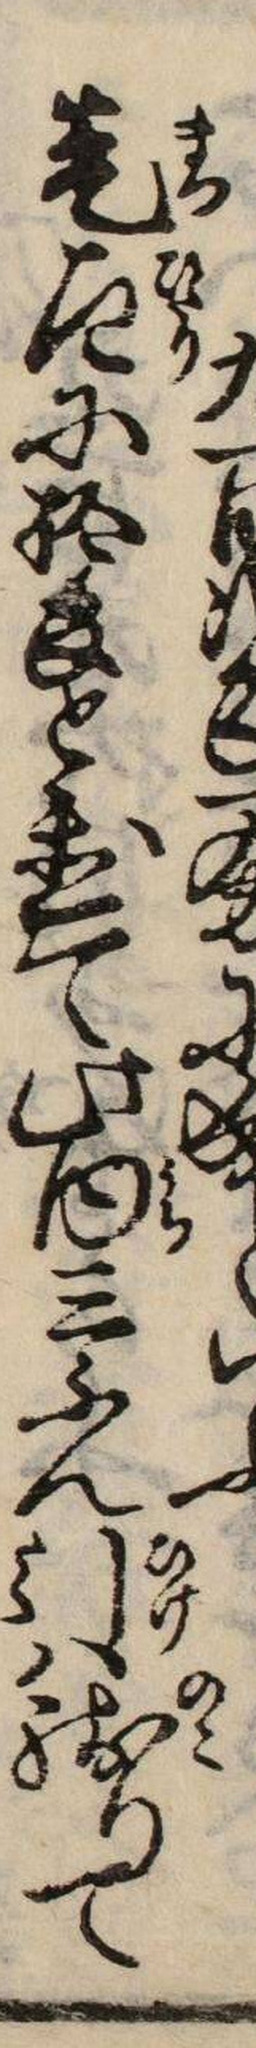先左に拾匁と置て此内三ふん引は残りて
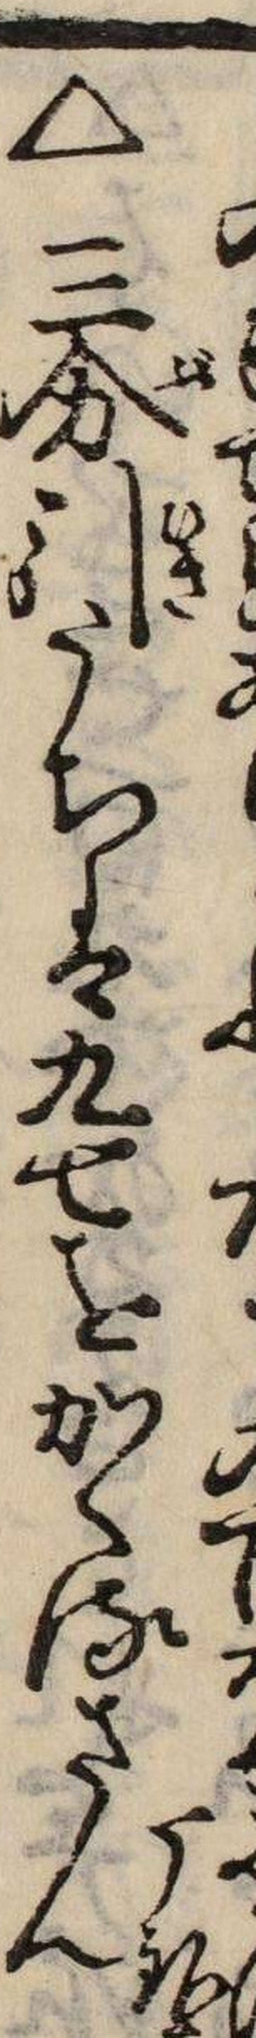△三分引うちは九七をかくるさん
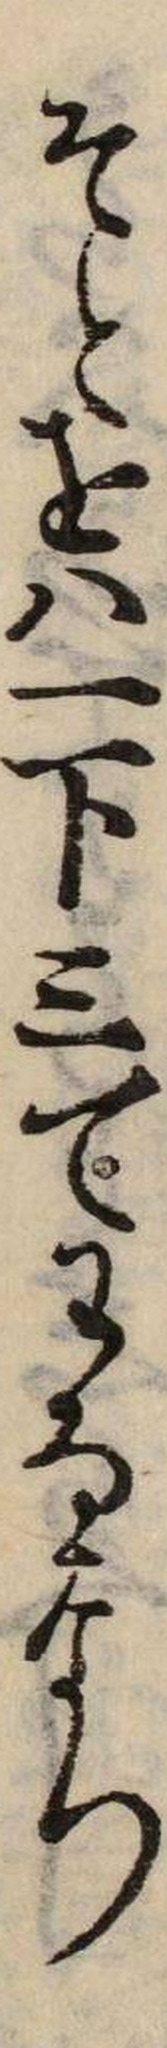そとをは一下三でわるなり
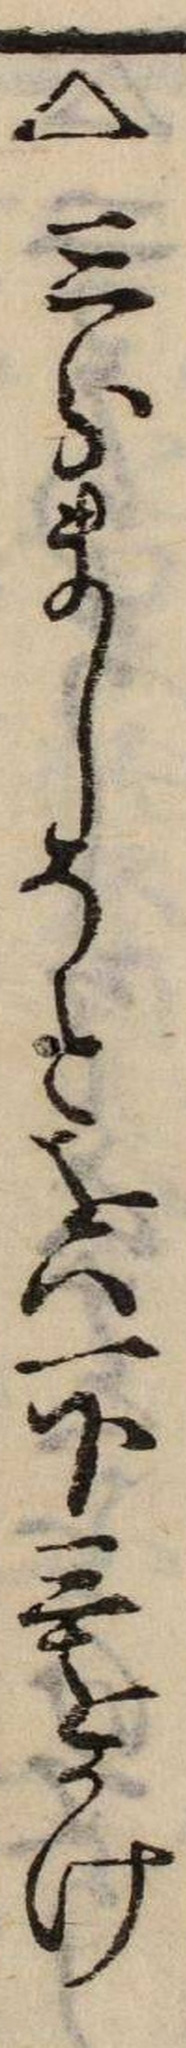△三分ましそとをは一下三をかけ
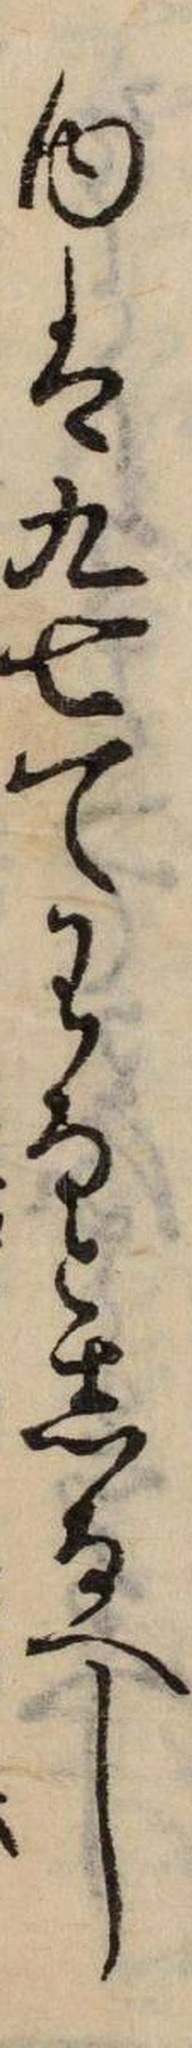内は九七てわるとしるへし
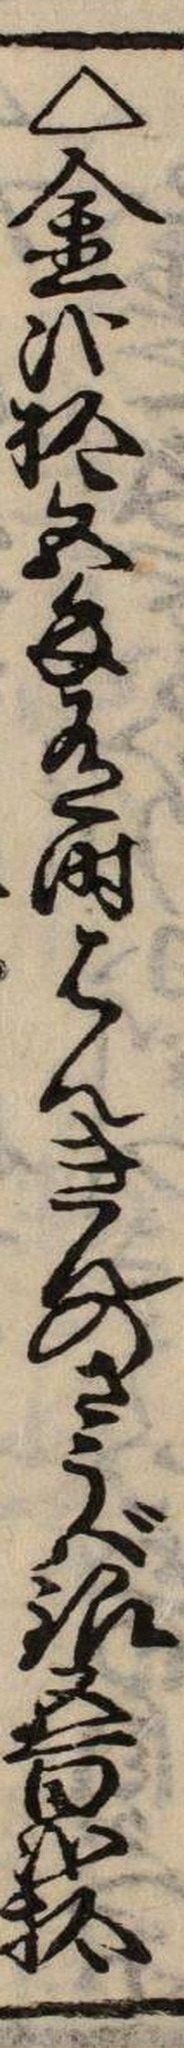△金弐拾五匁有時はんきんのさうば銀五百弐拾
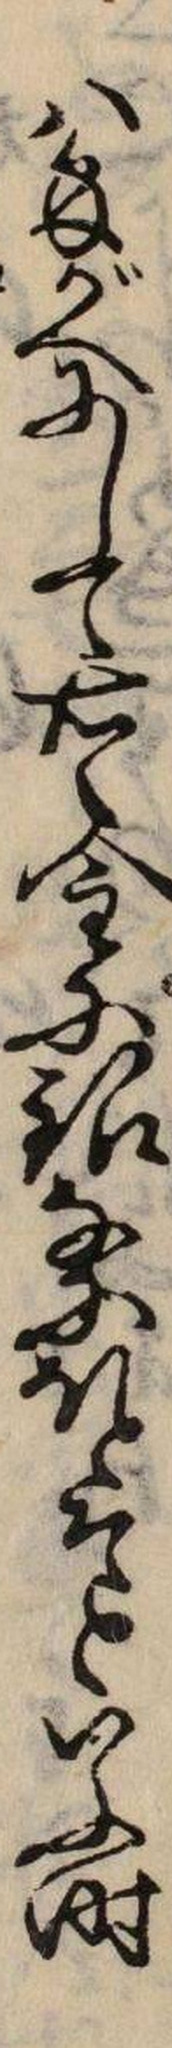八匁がへにして右の金に銀なにほとそといふ時
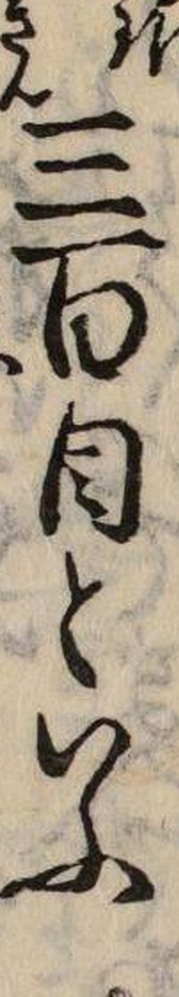銀三百目といふ
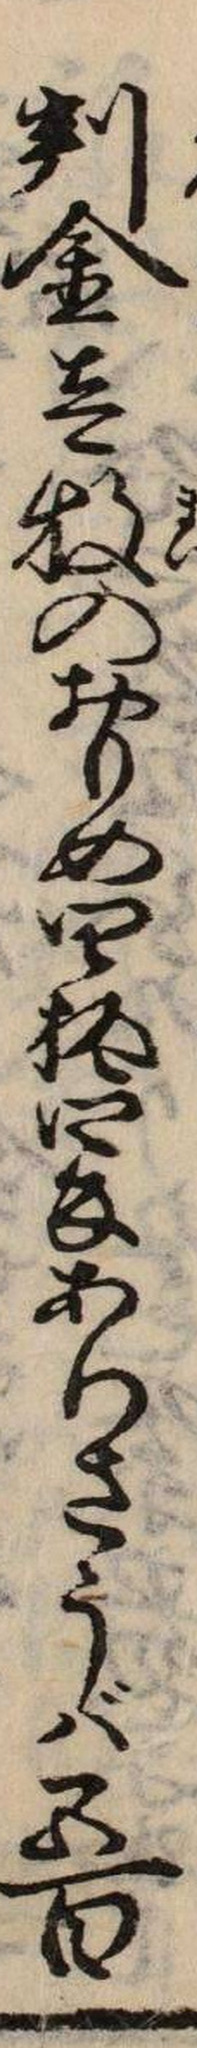判金壱枚のおもめ四拾四匁ありさうば五百
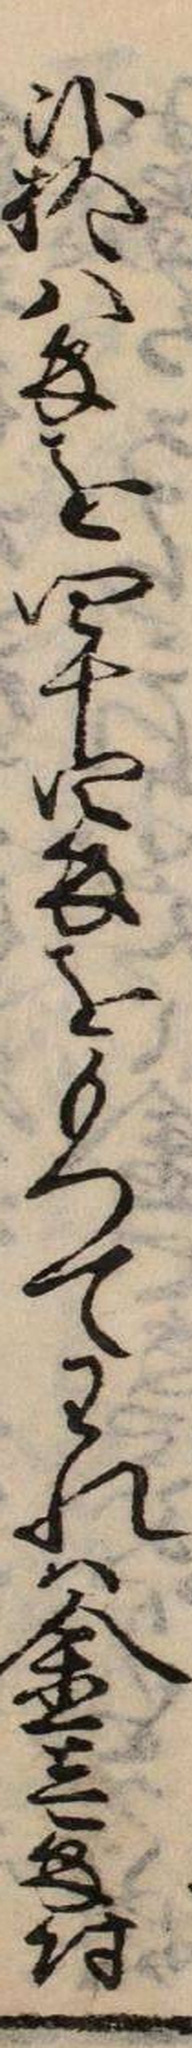弐拾八匁を四十四匁をもつてわれは金壱匁付
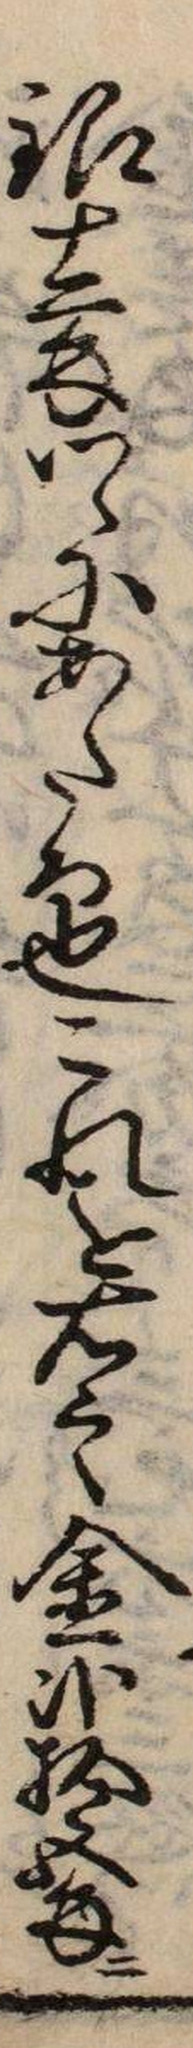銀十二匁つゝにあたる也これを右の金弐拾五匁に
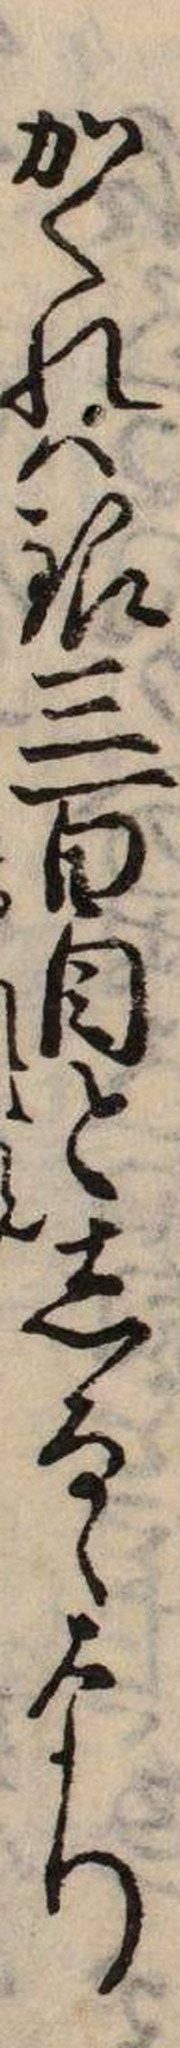かくれは銀三百目としるゝなり
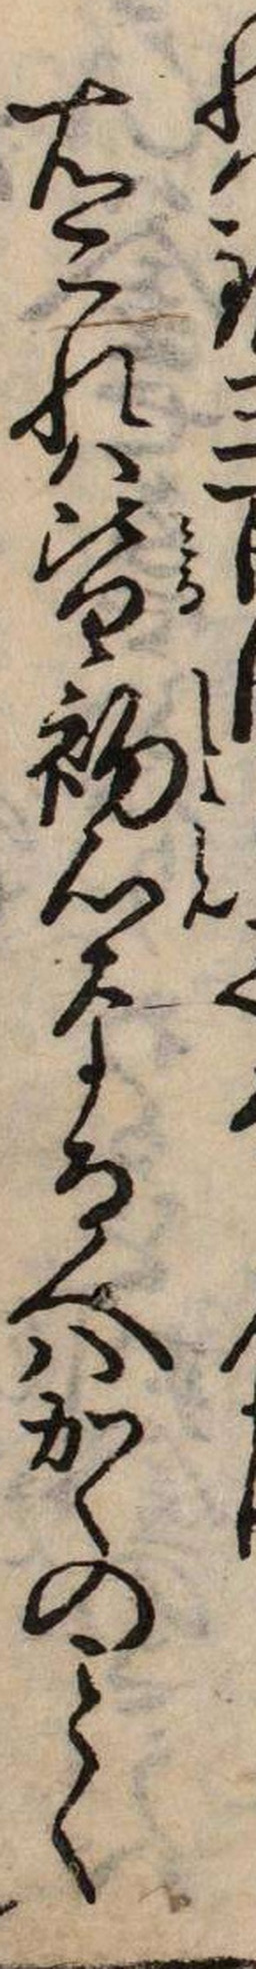右これは皆初心なる人はかくのことく
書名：塵劫記（寛永11年自跋、京都府立京都学・歴彩館追貴8）
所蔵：京都府立京都学・歴彩館 国文学研究資料館
